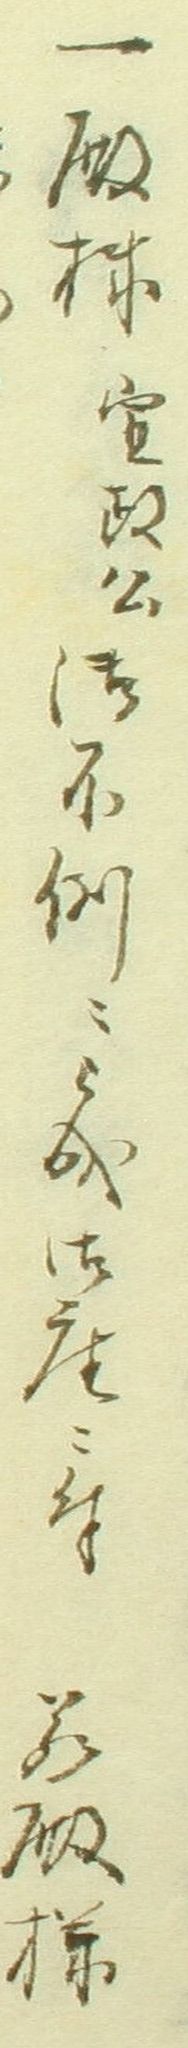一殿様宣政公御不側に被成御座に付前殿様
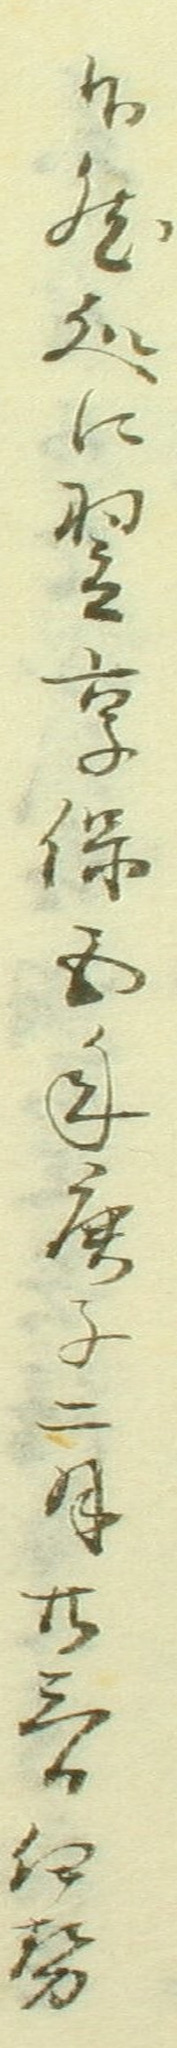候然処に翌享保五年庚子二月廿三日伊勢
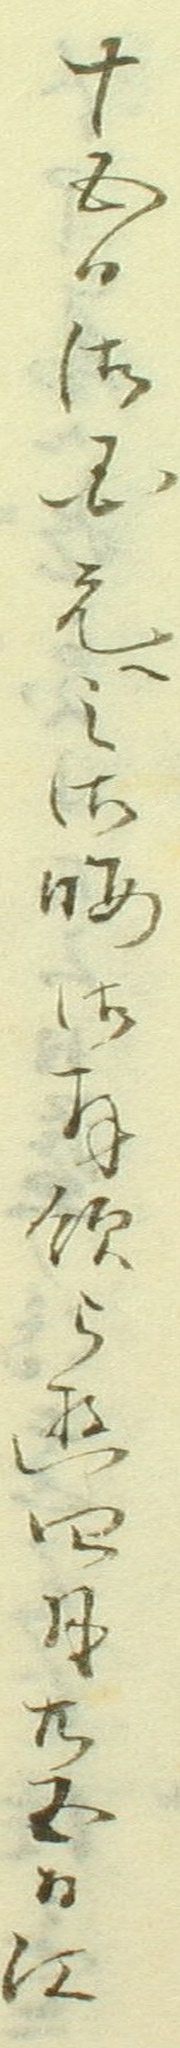十五日御国元へ之御晦御拝領被遊四月廿五日江
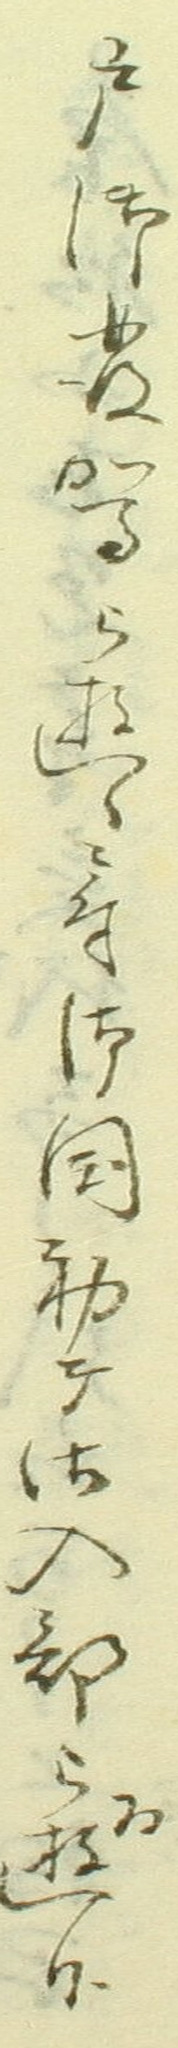戸御発駕被遊候に付御国初て御入部被為遊候
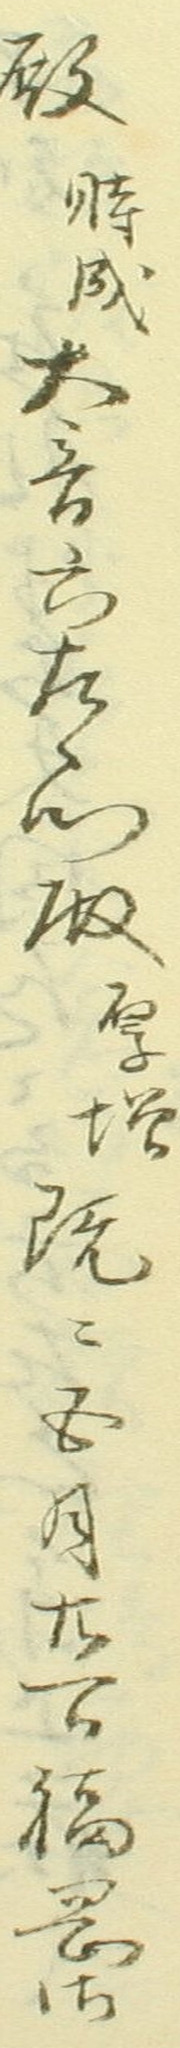殿時成大音六左衛門殿厚増既に五月廿一日福岡御
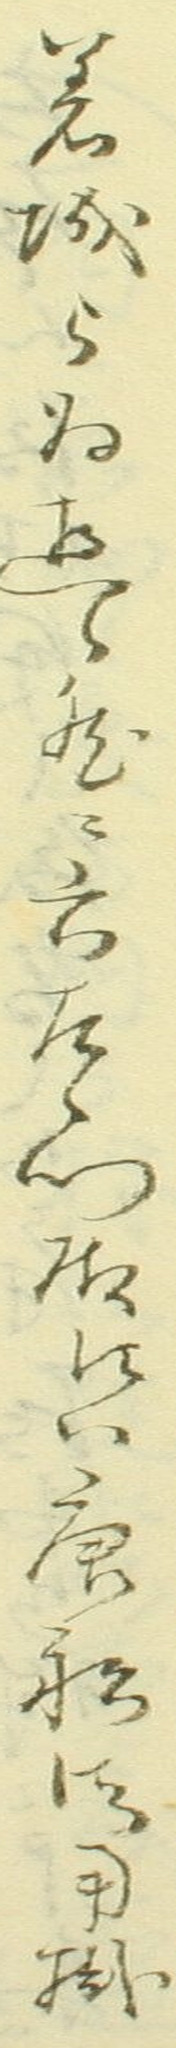着城被為迎候然に六左衛門殿江は唐船御用掛
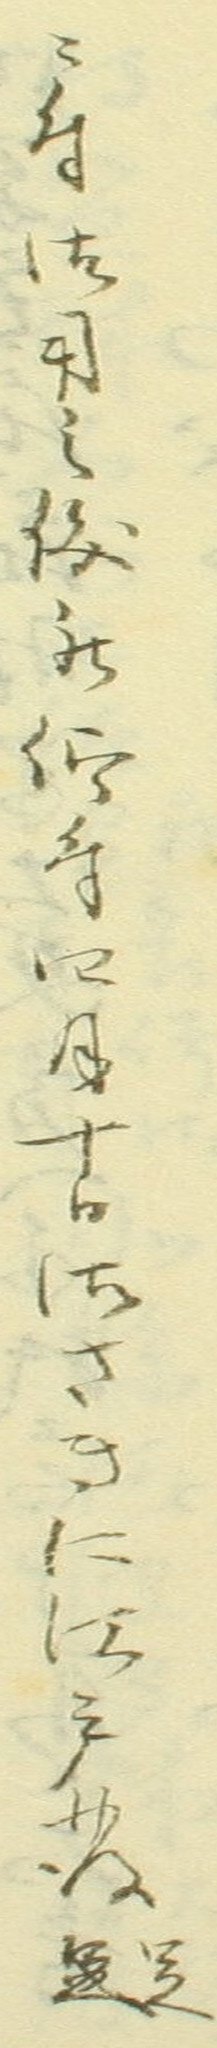に付御用之儀罷伝付四月十日御さきに江戸発？足
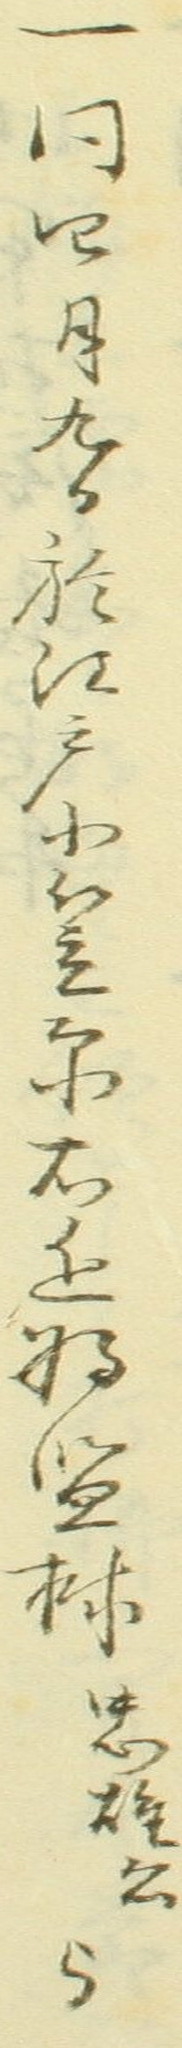一同四月九日於江戸小笠原右近将監様忠雄公と
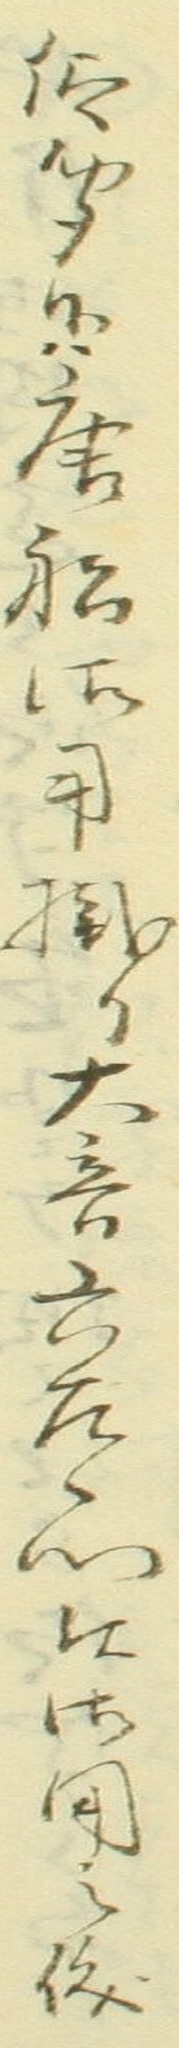仰聞候は唐船御用掛り大音六左衛門江御用之儀
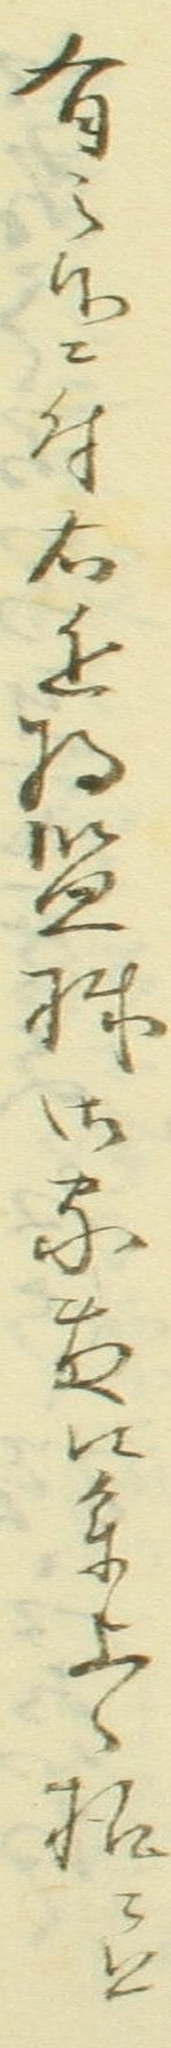有之候に付右近将監様御家敷江？上候様にと
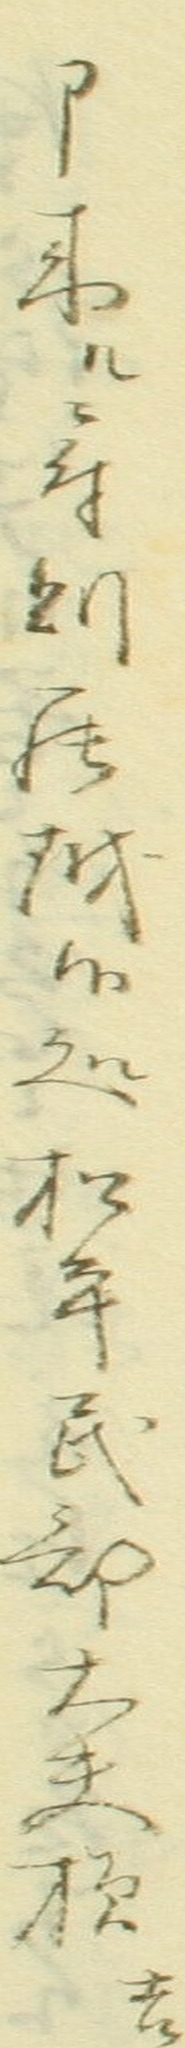申来るに付則罷越候処松平民部太夫様吉元
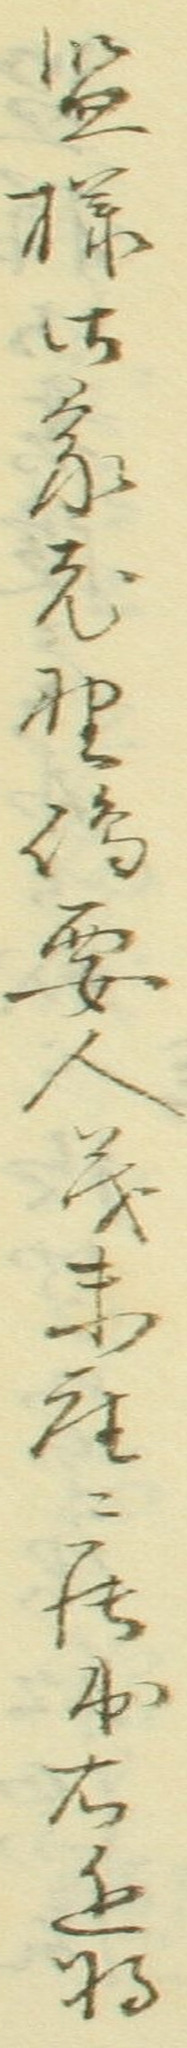監様御家老野嶋要人茂末座に罷出右近将

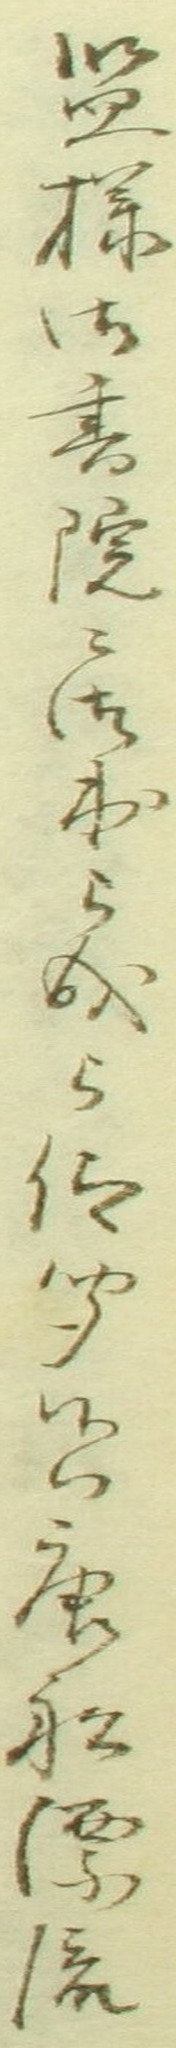監様御香院に御来被成被仰聞候は唐船漂流
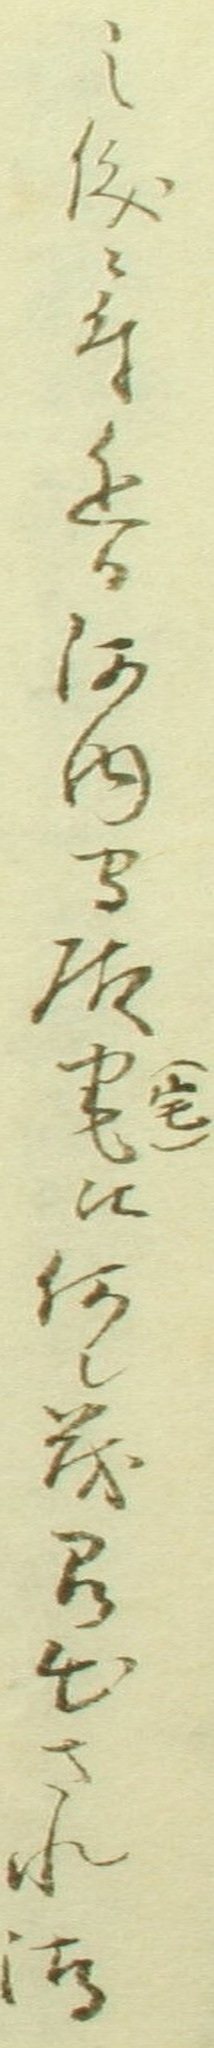之儀に付近日河内守殿宅江何れも召出され御
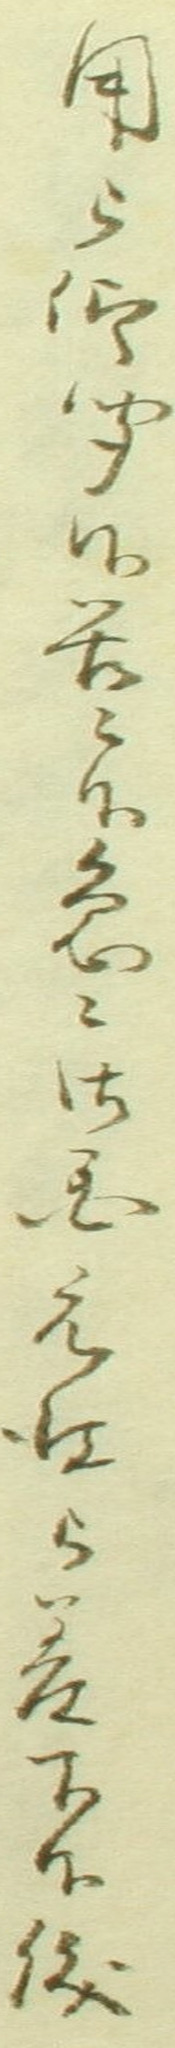用被仰聞候？に候急に御国元江被差下候儀
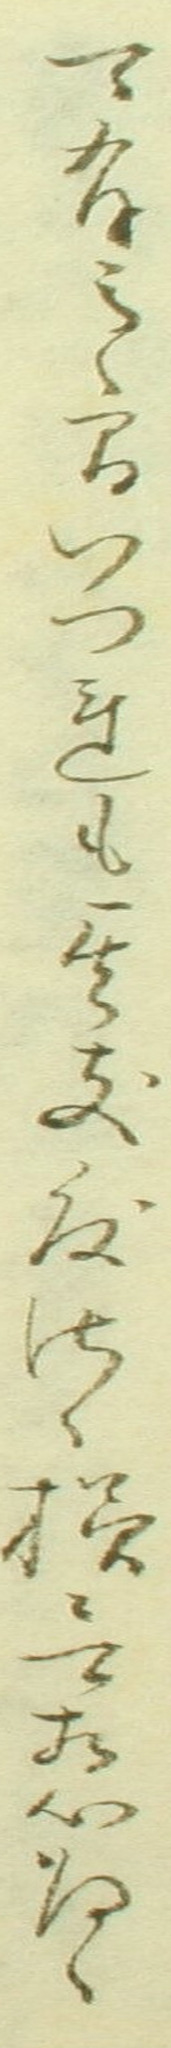可有之候間いつれも其支度仕候様にて相心得候
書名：唐船漂流記 四
